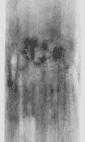四
